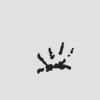至
